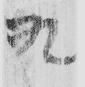九
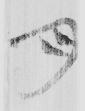月
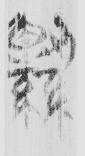{解絲}
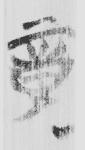章
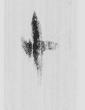十
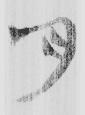月
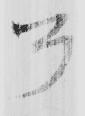乃
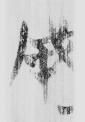成
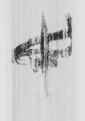民
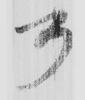乃
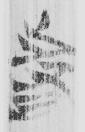時
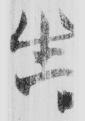生
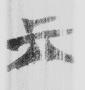亓
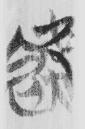{既火}
